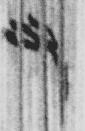又
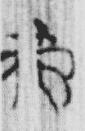夫
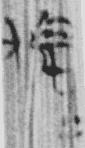柱柱
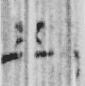之
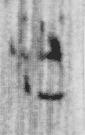心
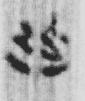出
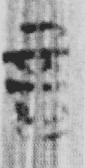言
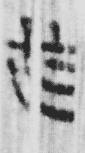必
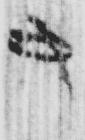又
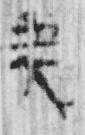夫
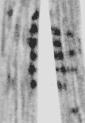柬柬
